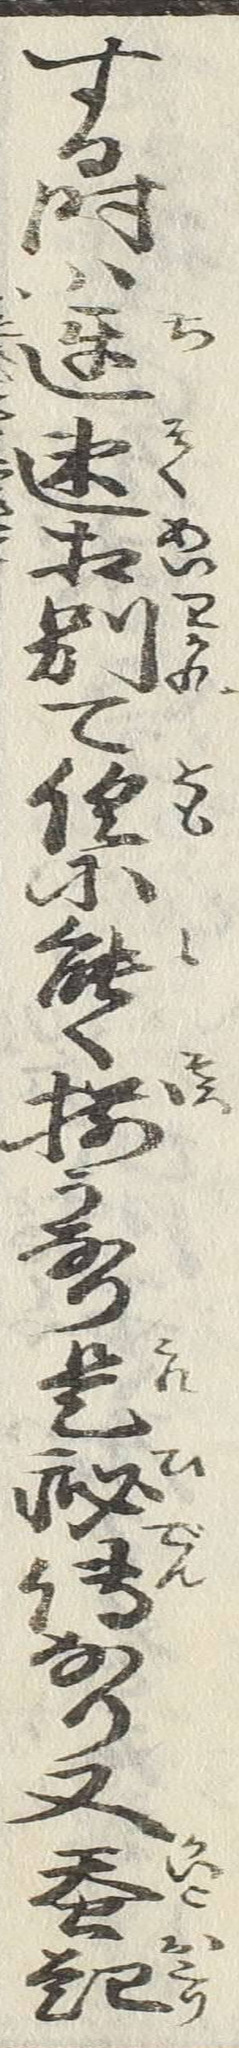する時は遅速相別て倶に能く揃うなり是秘傳なり又蚕起
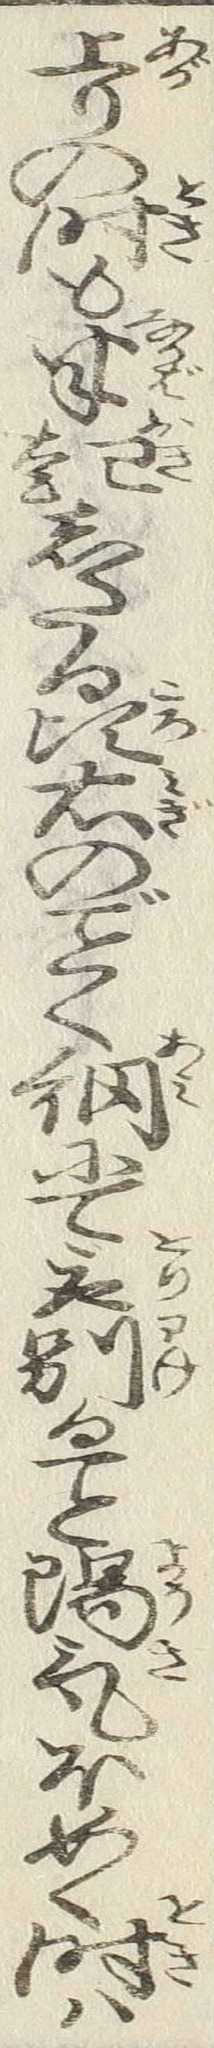上りの時も半起したる頃右のごとく網にて取別ること陽気ほめく時は
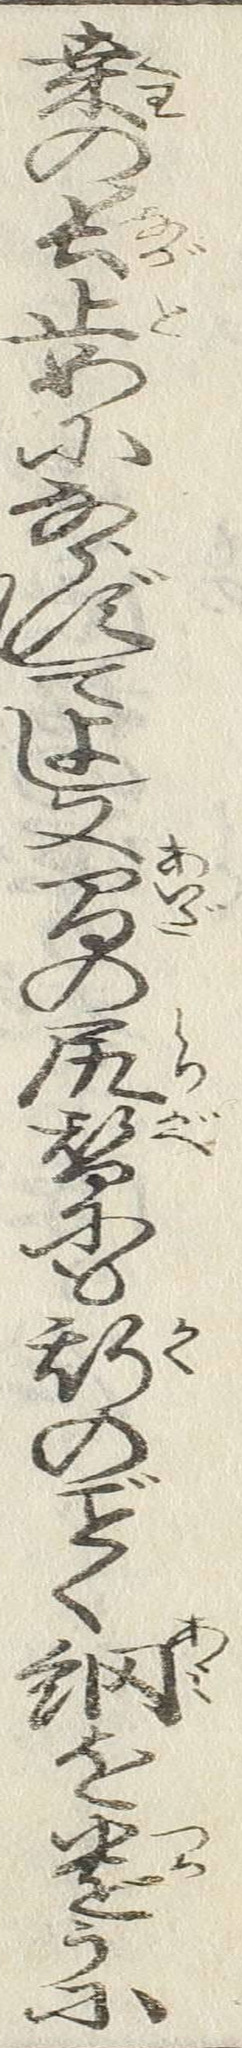桑の長止めにならずしてよし又間の尻替にも斯のごとく網を遣うに
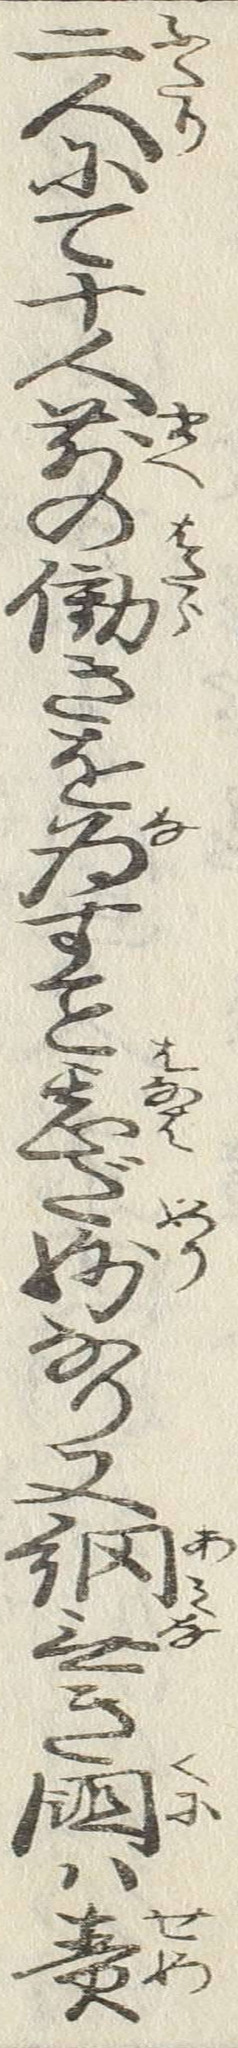二人にて十人前の働きを為すこと甚だ妙なり又網無き國は責
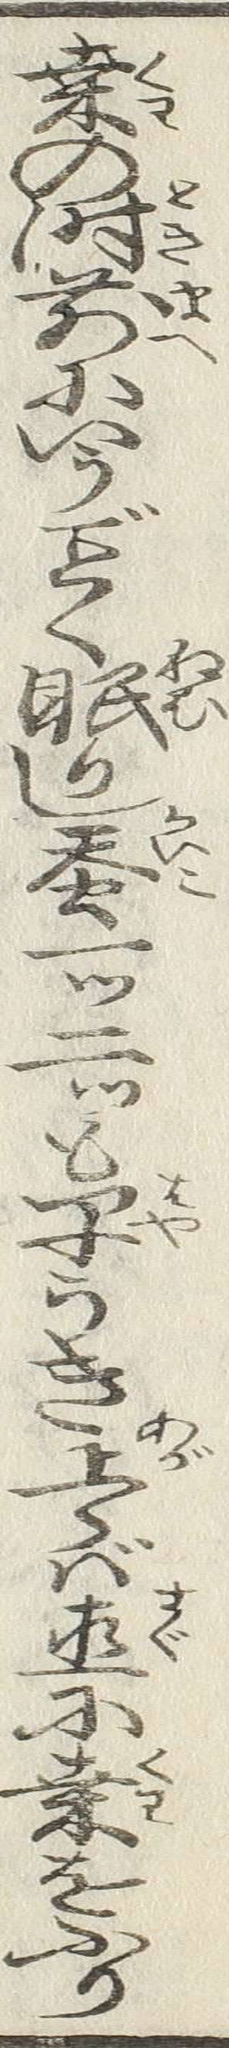桑の時前にいうごとく眠りし蚕一ッ二ッも早うき上らば直に桑をふり
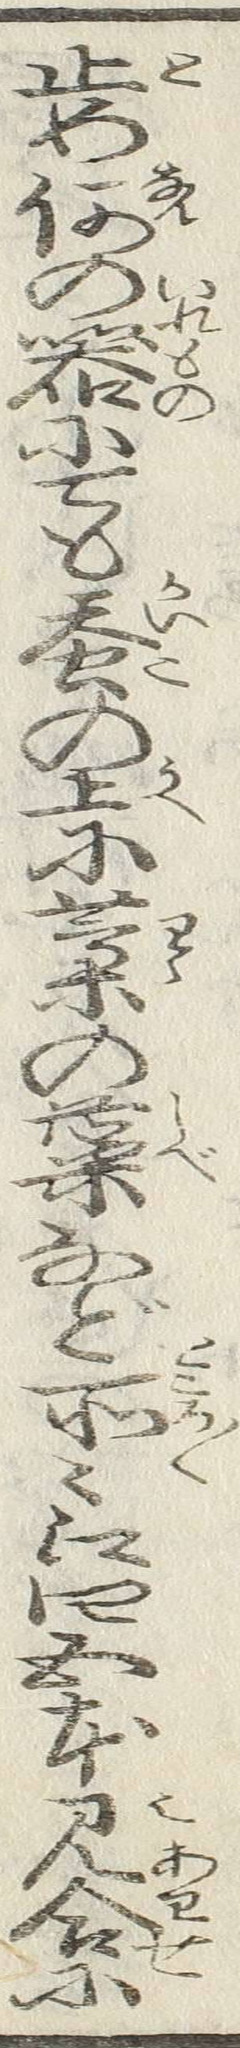止め何の器にても蚕の上に藁の蘂など所々え四五本見合に
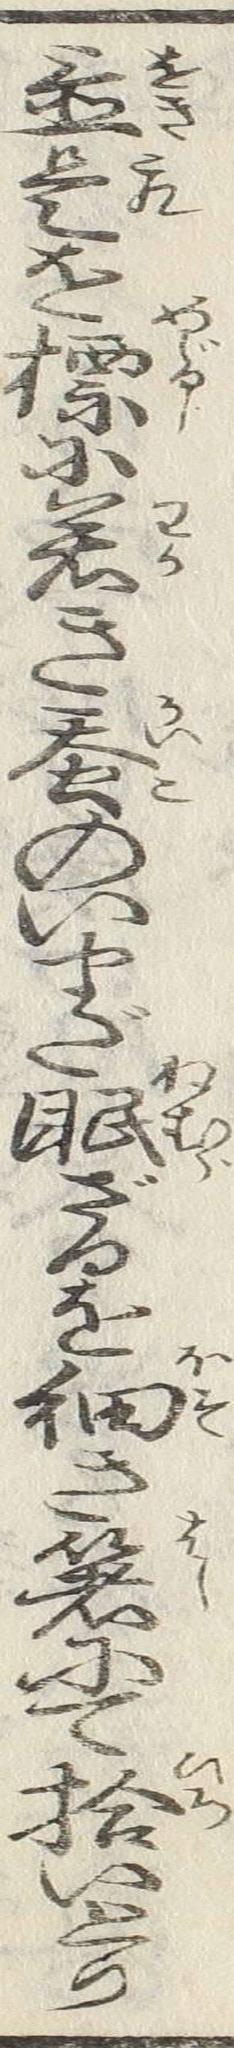置是を標に若き蚕のいまだ眠ざるを細き箸にて拾いとり
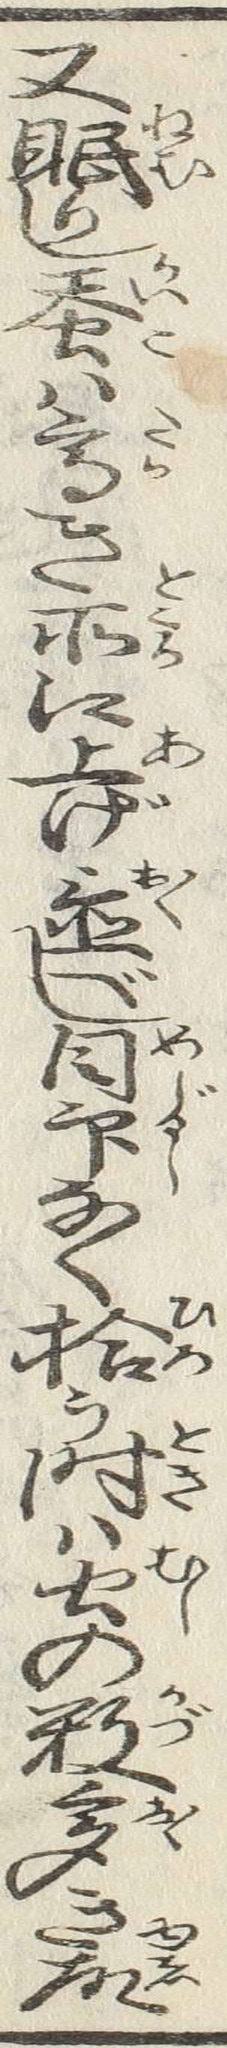又眠りし蚕は高き所え上げ置べし目印なく拾う時は虫の数多き故
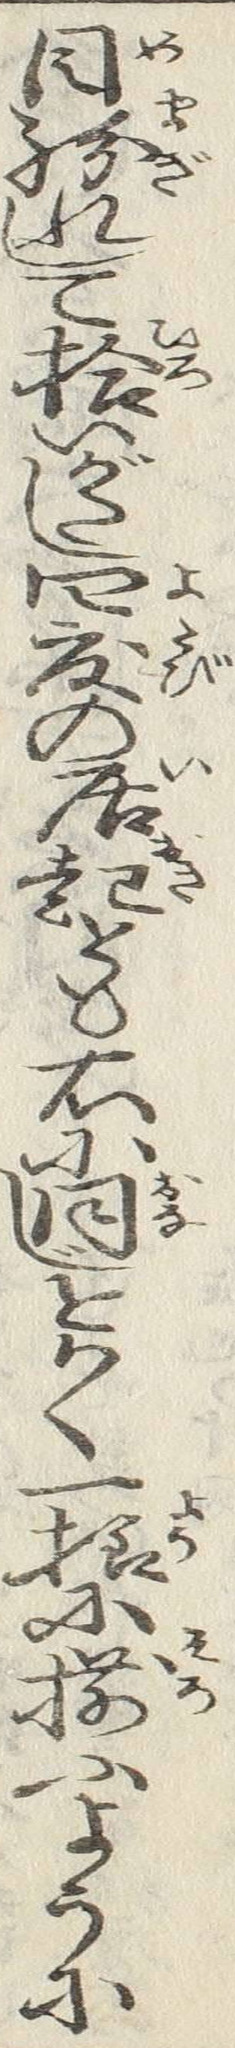目紛れして拾いがたし四度の居起とも右に同じとかく一様に揃ふように
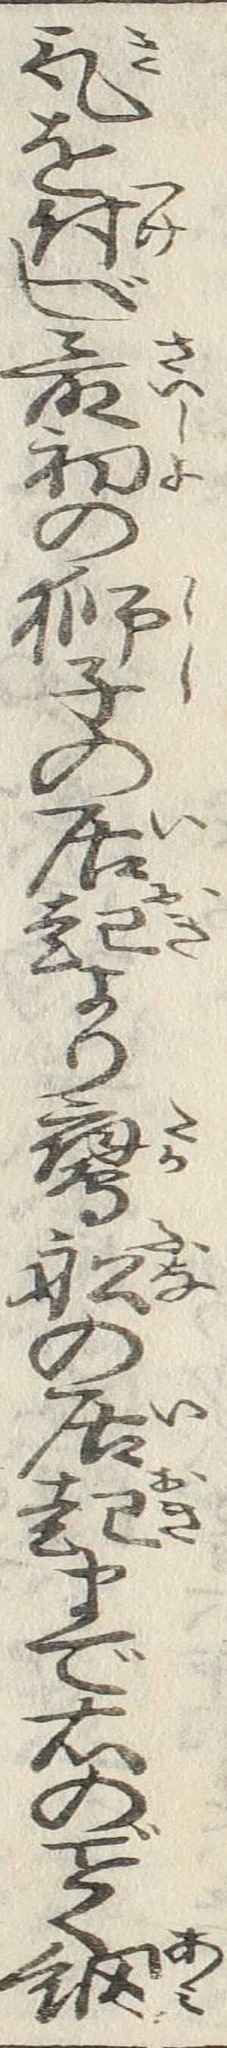気を付べし最初の獅子の居起より鷹舩の居起まで右のごとく網
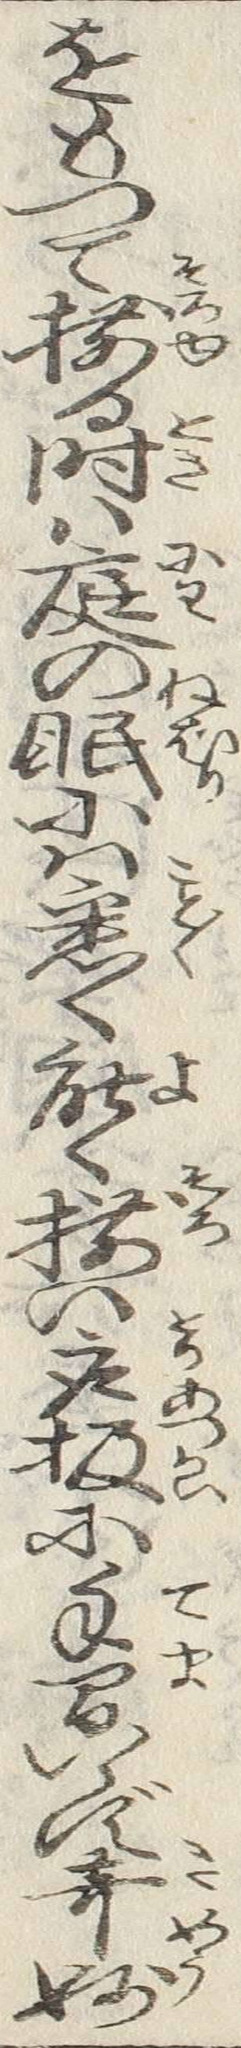をもつて揃る時は庭の眠には悉く能く揃い取扱に手間いらず奇妙

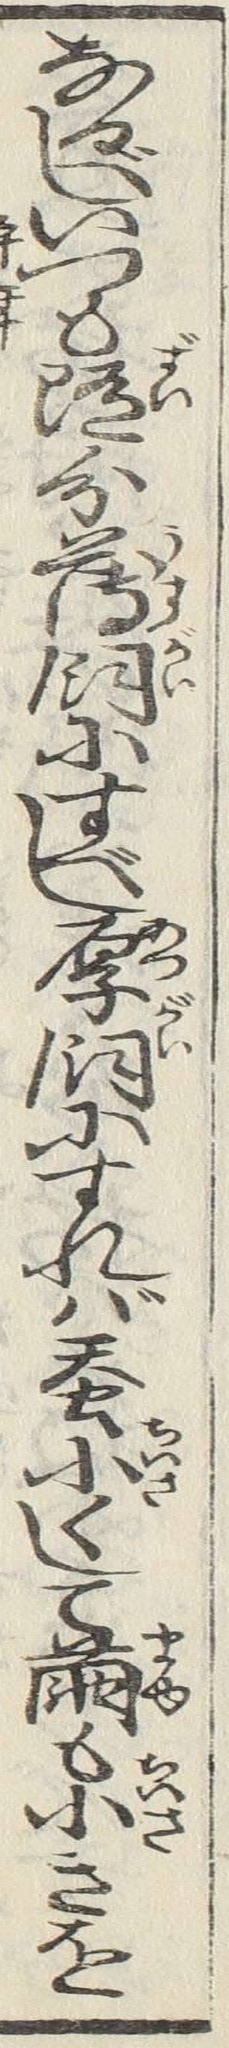なるべしいつも随分薄飼にすべし厚飼にすれば蚕小くして繭も小きを
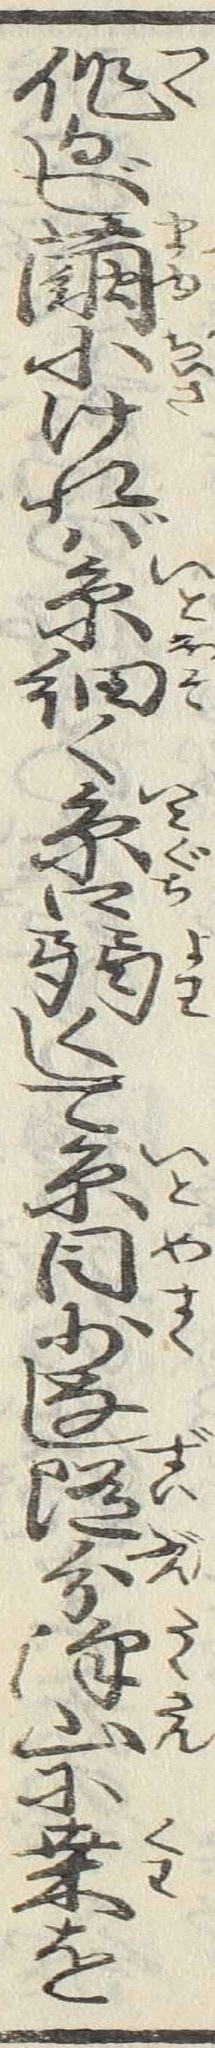作るべし繭小ければ糸細く糸口弱くして糸目少なし随分沢山に桑を
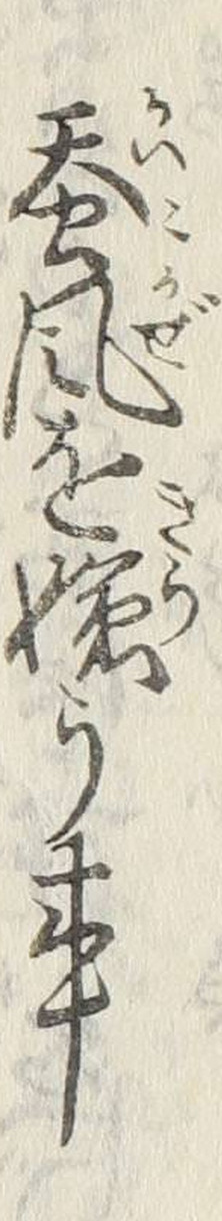蚕風を嫌う事
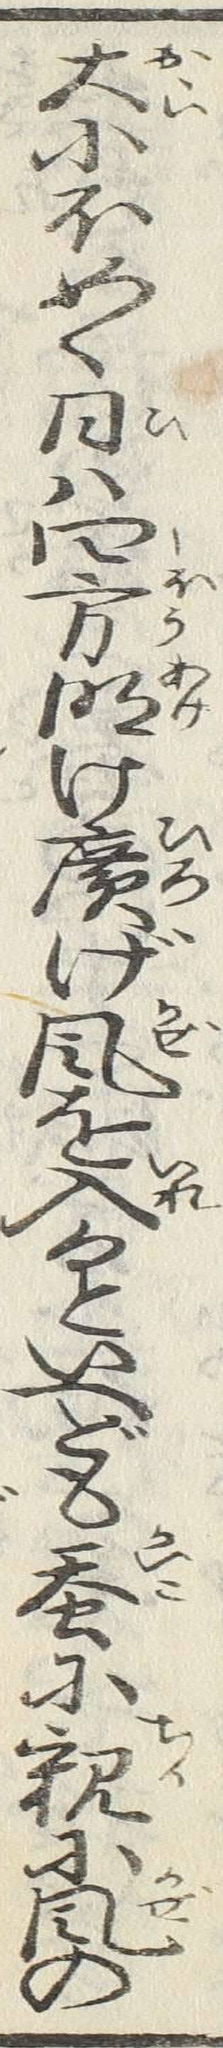大にほめく日は四方明け廣げ風を入るといへども蚕に親に風の
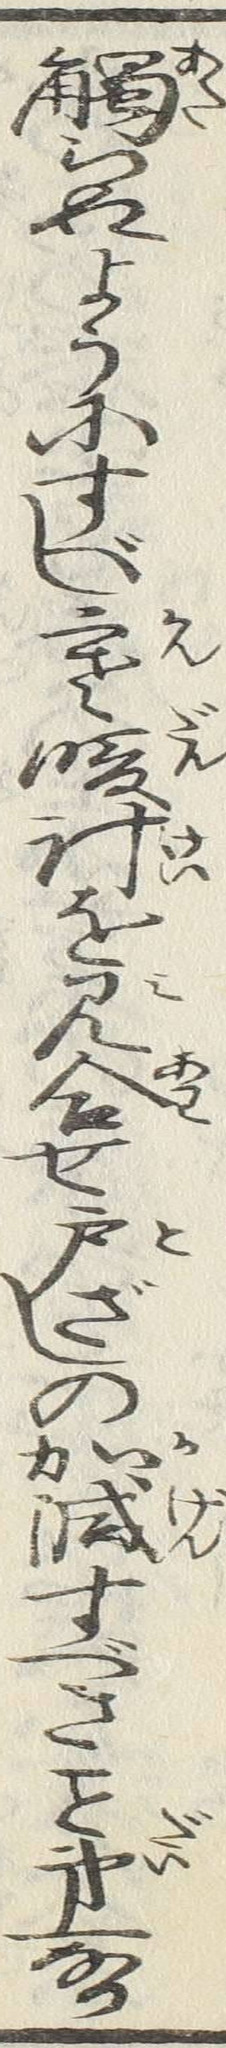觸らぬようにすべし寒暖計を見合せ戸ざしの加減すべきこと第一なり
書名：養蠶實驗録
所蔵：東京大学農学生命科学図書館 国文学研究資料館
